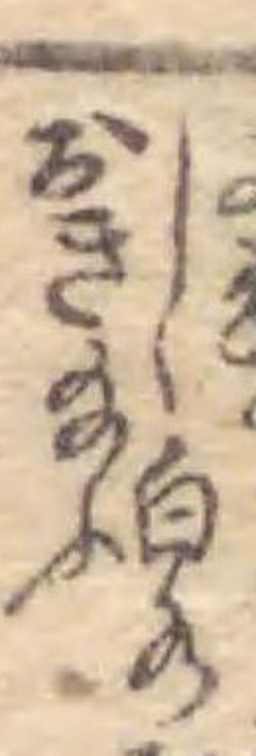おき給ふ
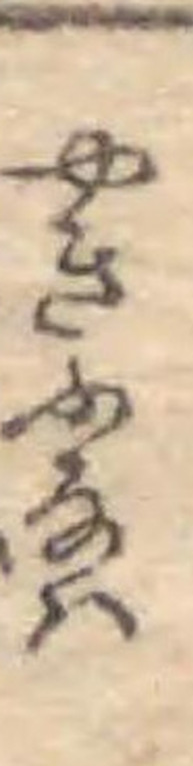やきふなは
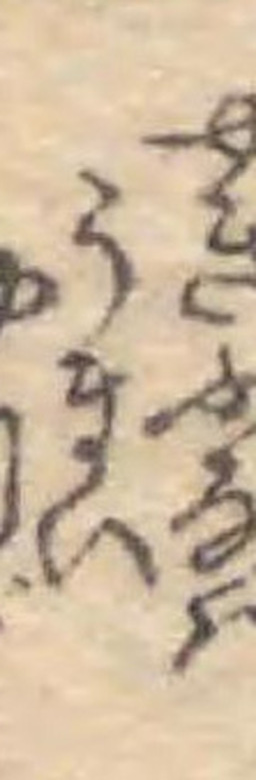うまい
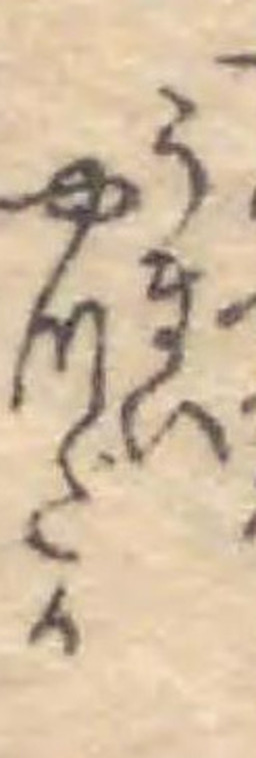やつだか
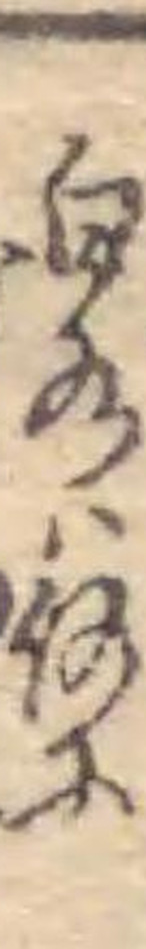白水は何に
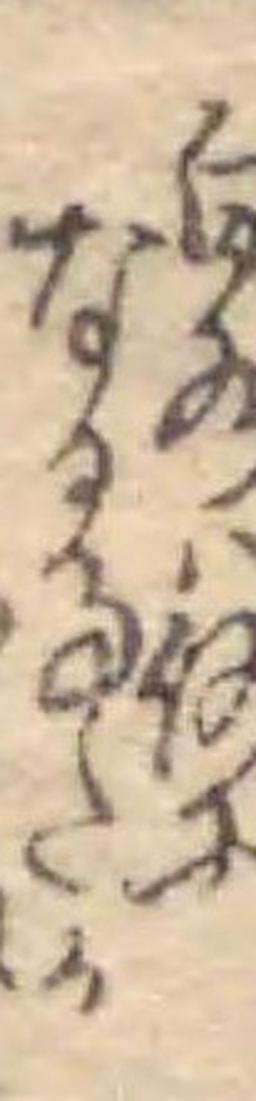なる事たか
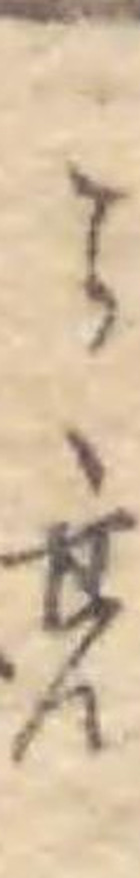よくせん
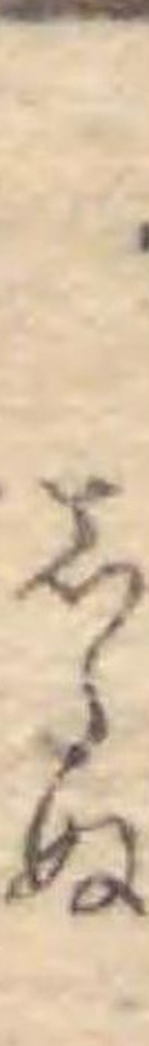しらぬ
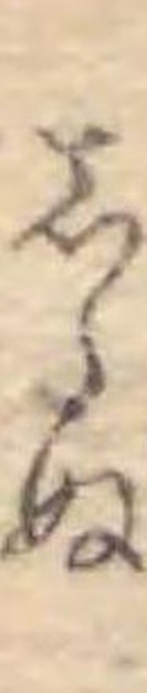しらぬ
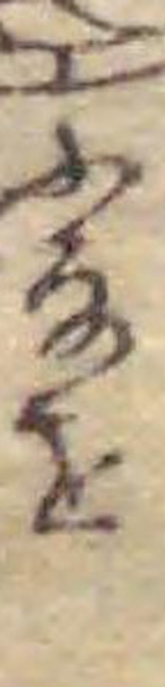ふなを
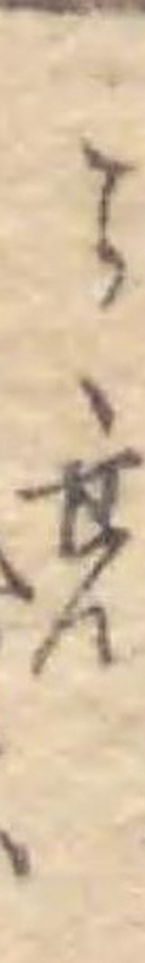よくせん
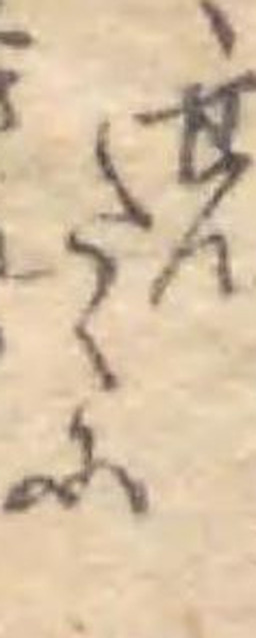たくに
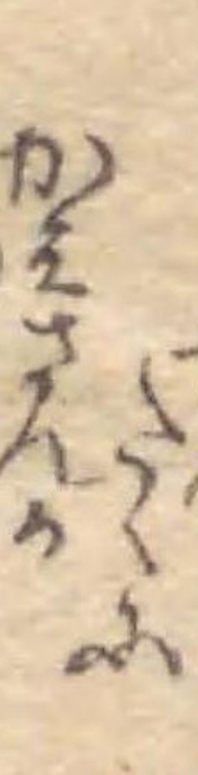かみさんか
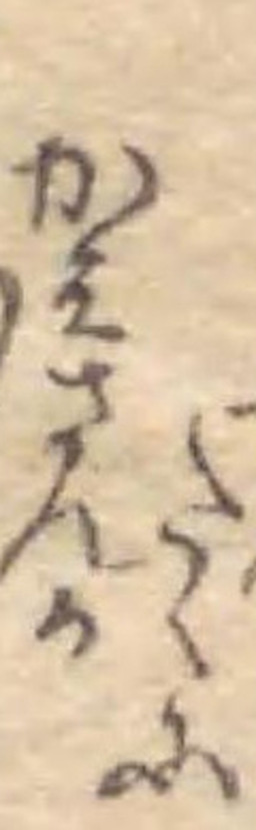かみさんか
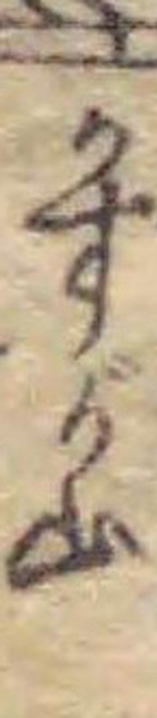かすが山
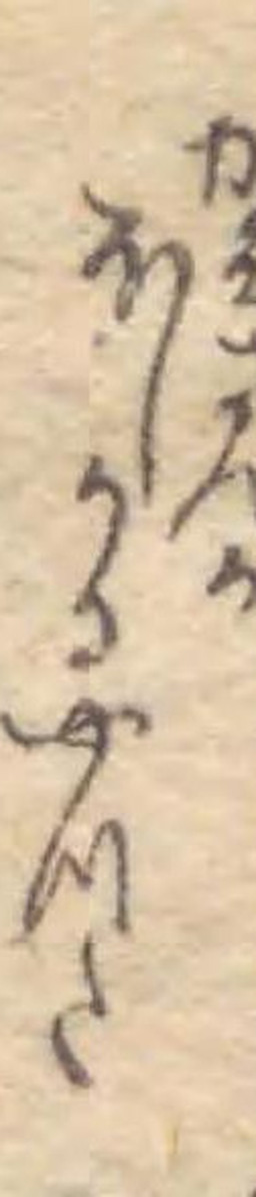ほしかるやつた
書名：悦贔負蝦夷押領 : 3巻
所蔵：国立国会図書館 National Diet Library, JAPAN
